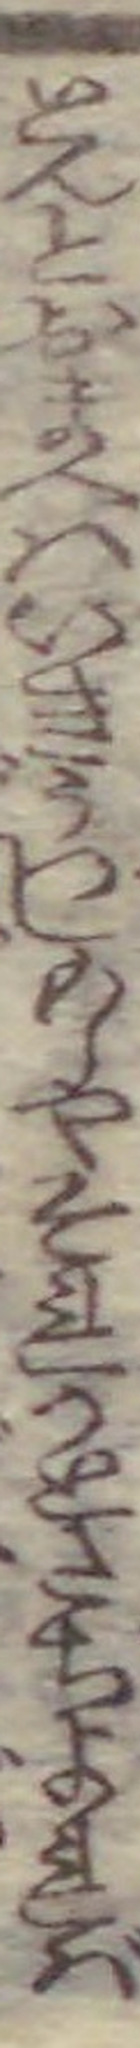とんとおまへはいきうつしもしやそれかとたちよれば
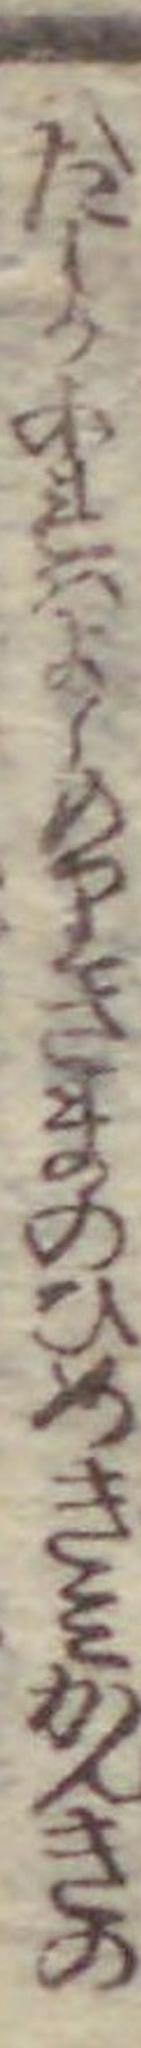〽たしかあれはよしもりさまのひめぎみかんきの
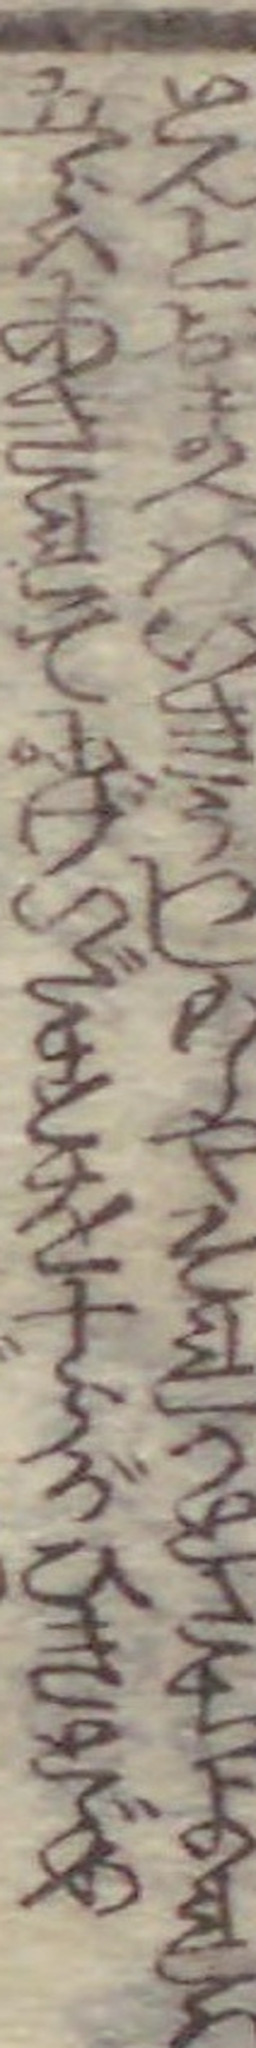五郎あきれてにげいだすを十郎がひきとゞめ
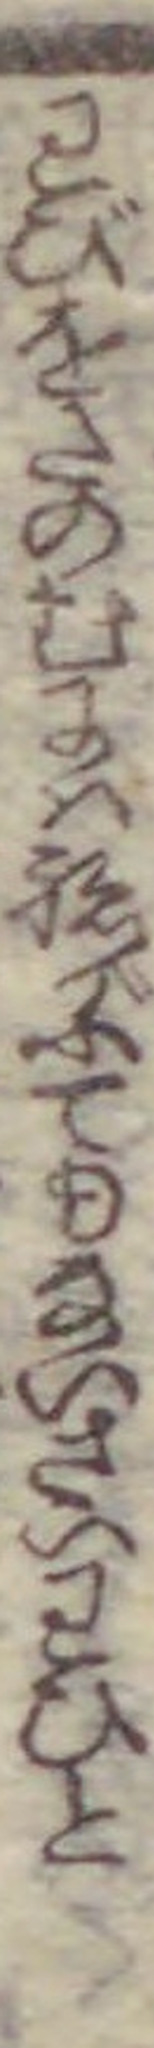わびをたのむにはねがふてもないさいわいと
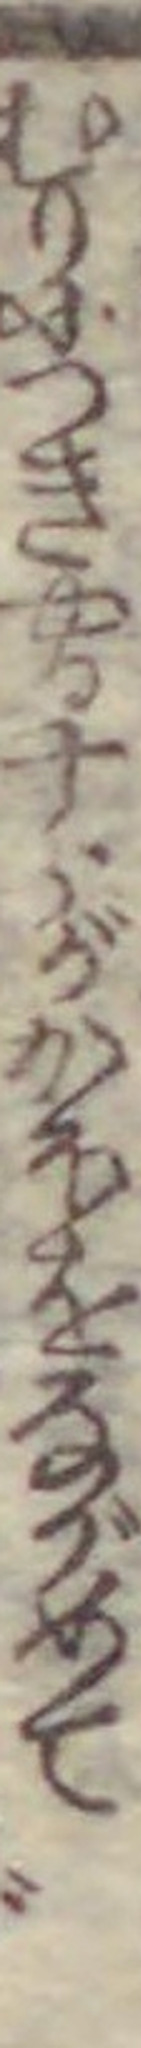むりにつきやる十郎がかほをながめて
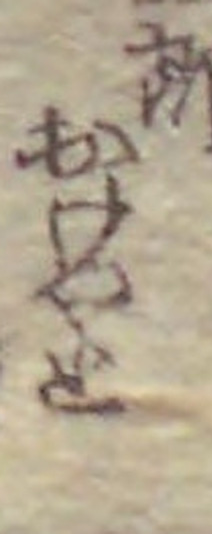おけやと
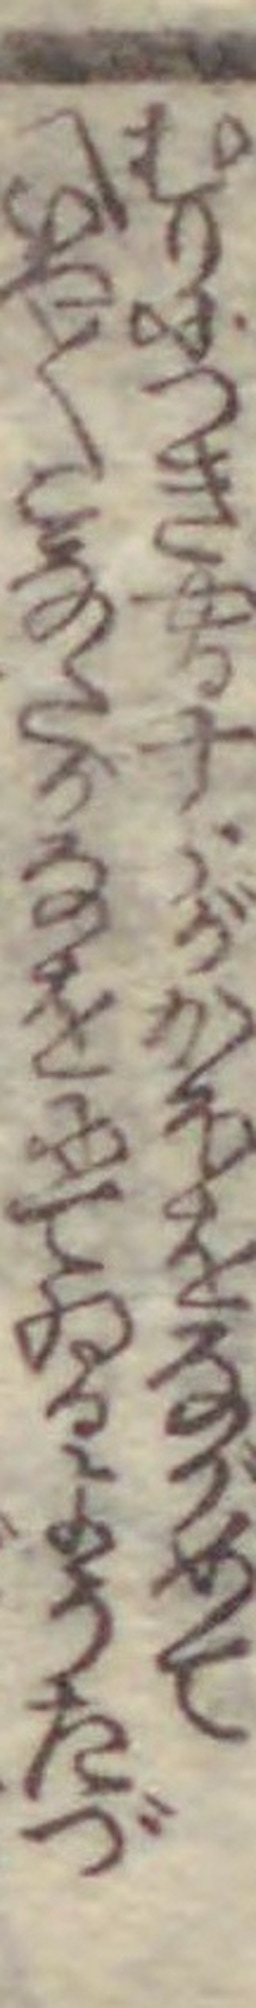〽いや〳〵こなたゟなをにていゐるようたづ
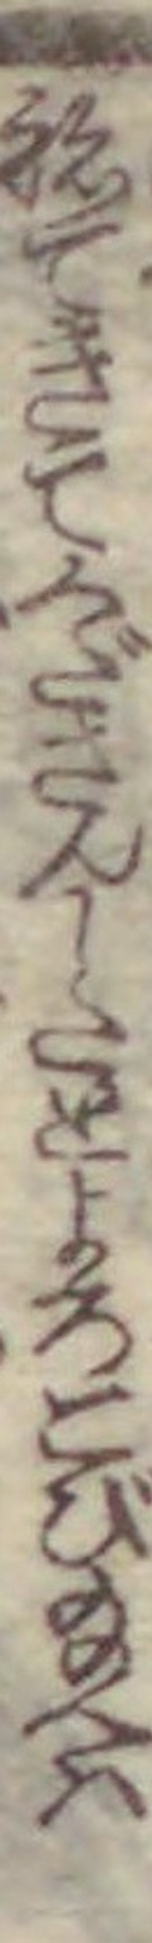ねてきてくださんしたとよろこび給へは
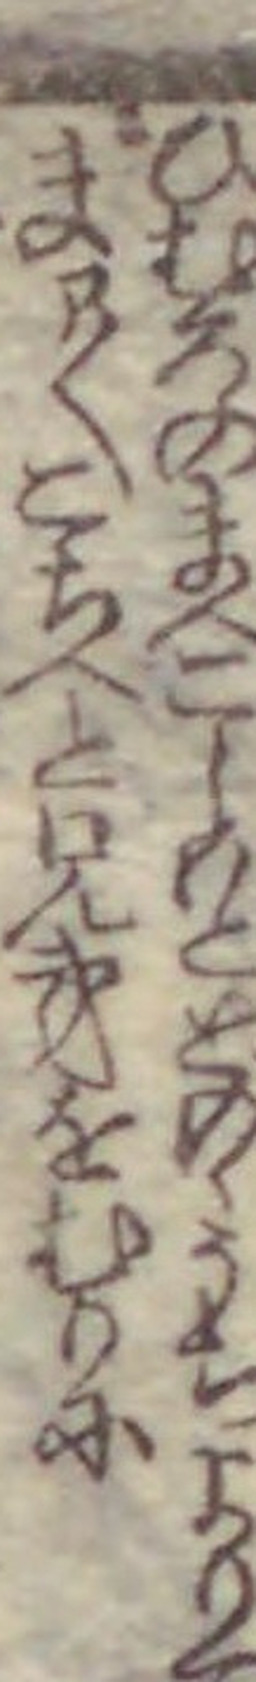まァ〳〵こちへと兄弟をむりに
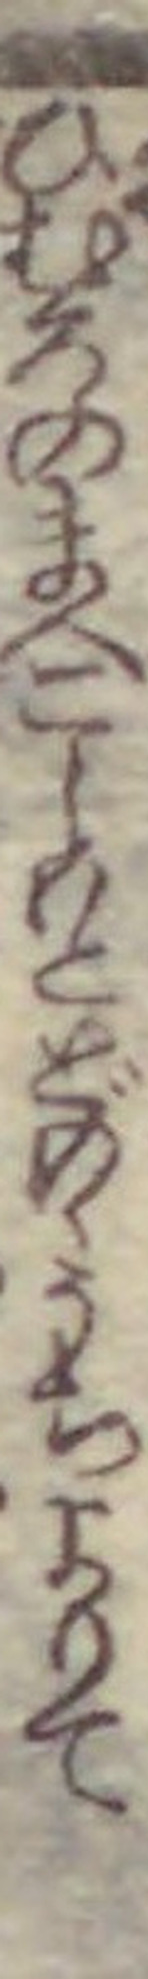ひむろのまへこしもとどのゝうちよりて
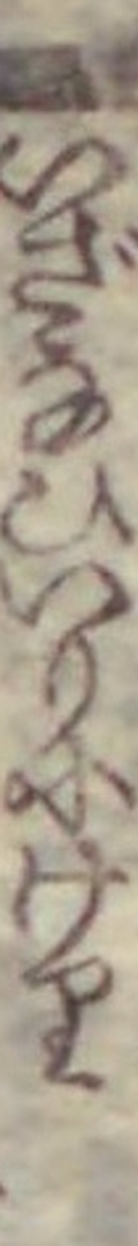いざなひいりにけり
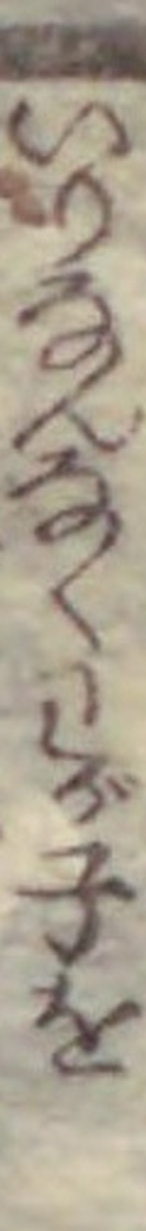いりなんなくわが子を
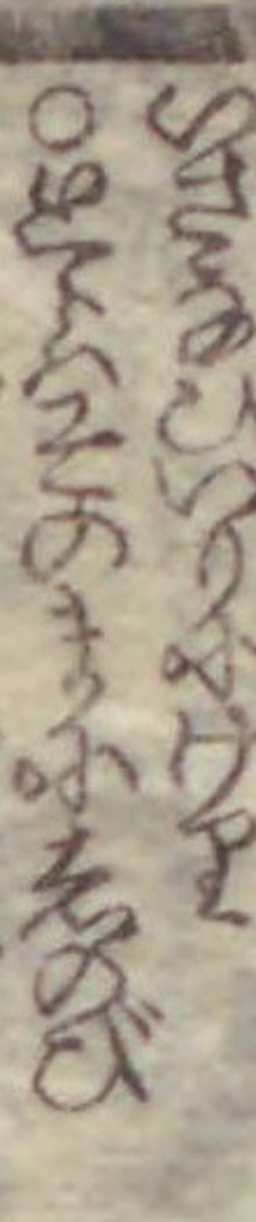○とらはそのまにしのび
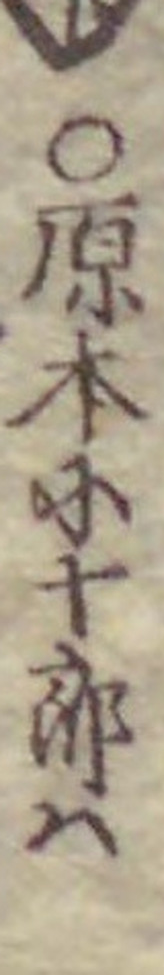○原本に十郎は
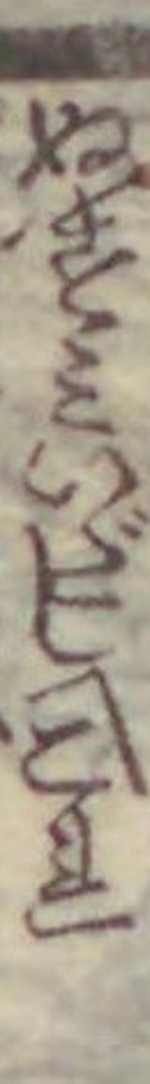ぬすみいだし〽これ
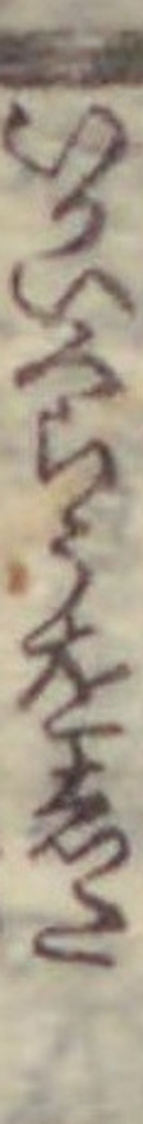いかいくらうをした
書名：大時代唐土化物 3巻. 曽我太夫染
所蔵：国立国会図書館 National Diet Library, JAPAN
